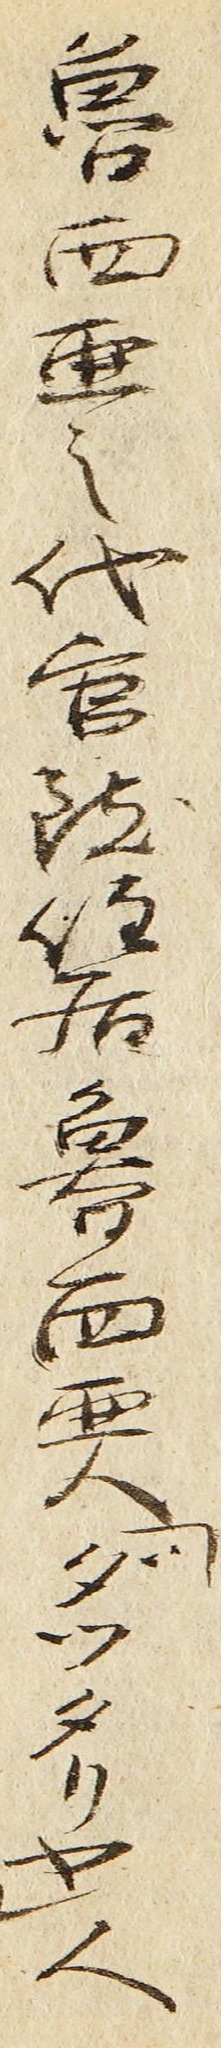魯西亜之代官致住居魯西亜人「ダツタリヤ」人
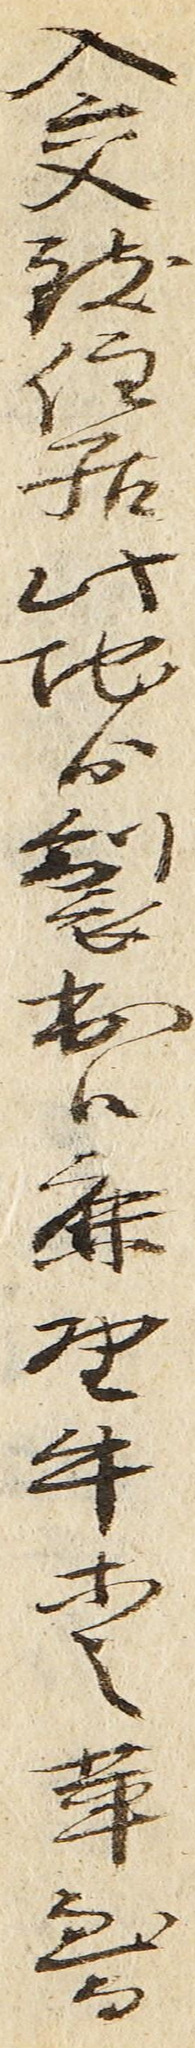入交致住居此地ゟ製出候鹿野牛等之革過て
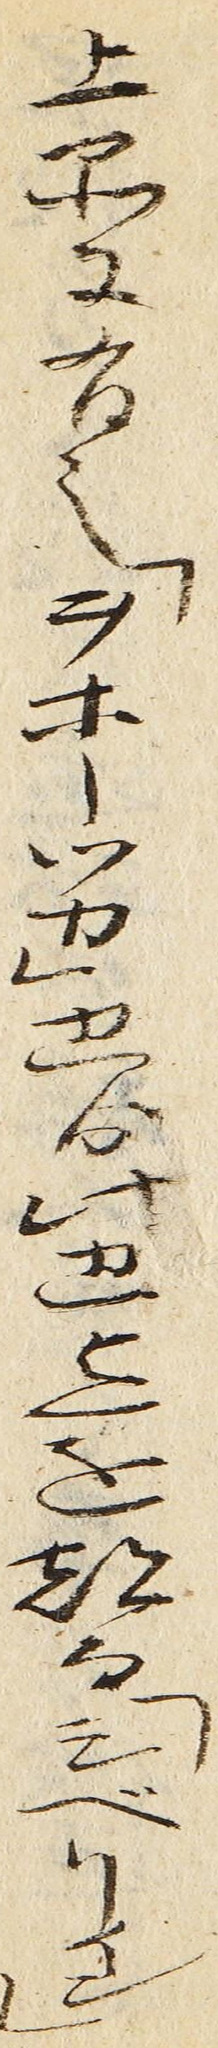上品に有之「ヲホーツカ」辺ゟ此辺迄を都て「シベリイン」
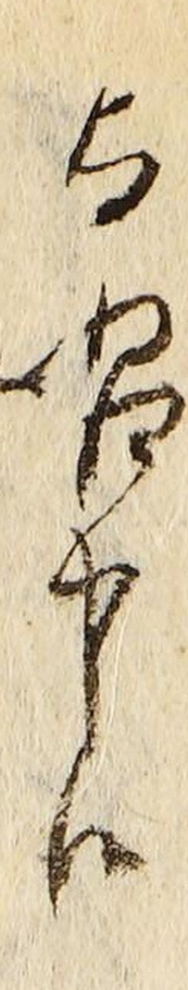と唱申候
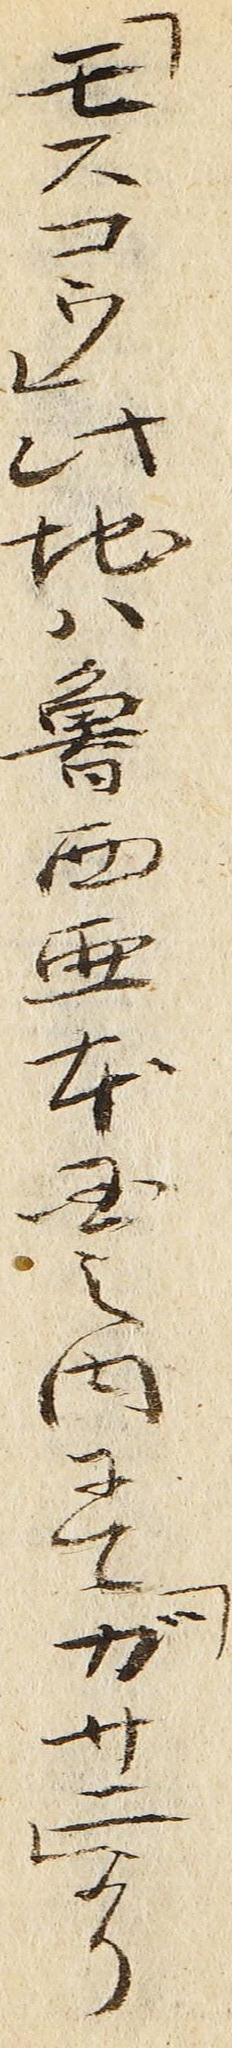「モスコウ」此地は魯西亜本国之内にて「ガサニ」より
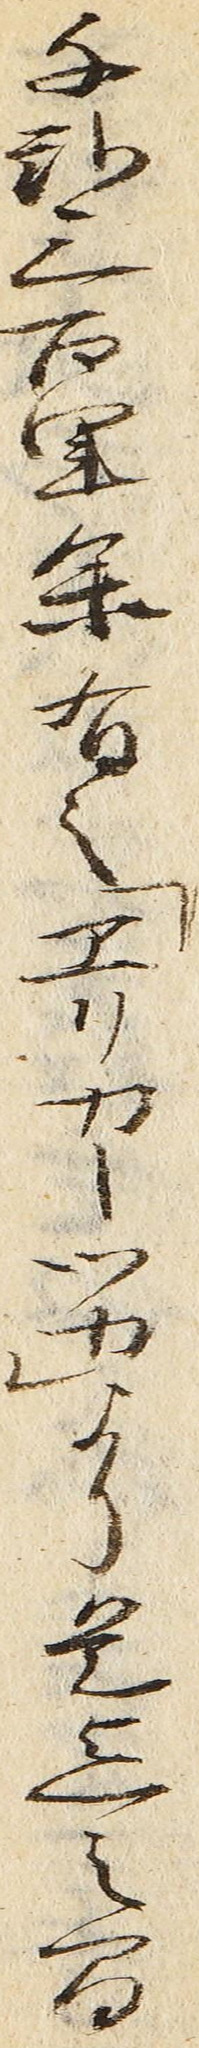千弐三百里余有之「ヱリカーツカ」より是迄之間
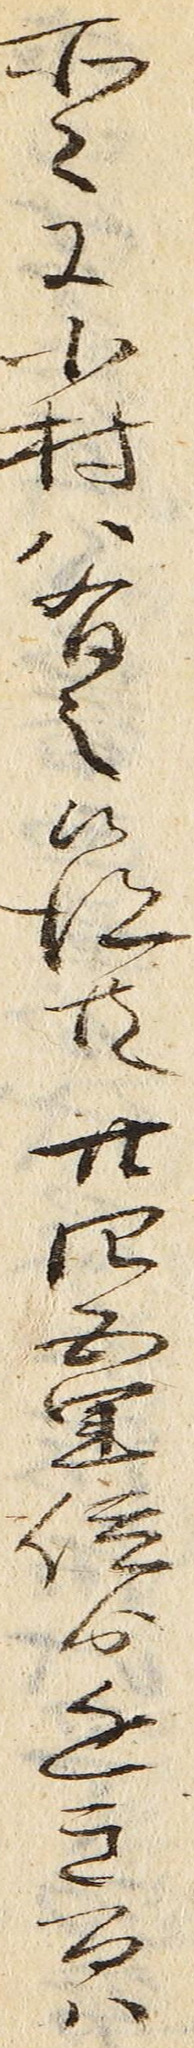所々に小村は有之候得共廿四五里位ゟ近き間は
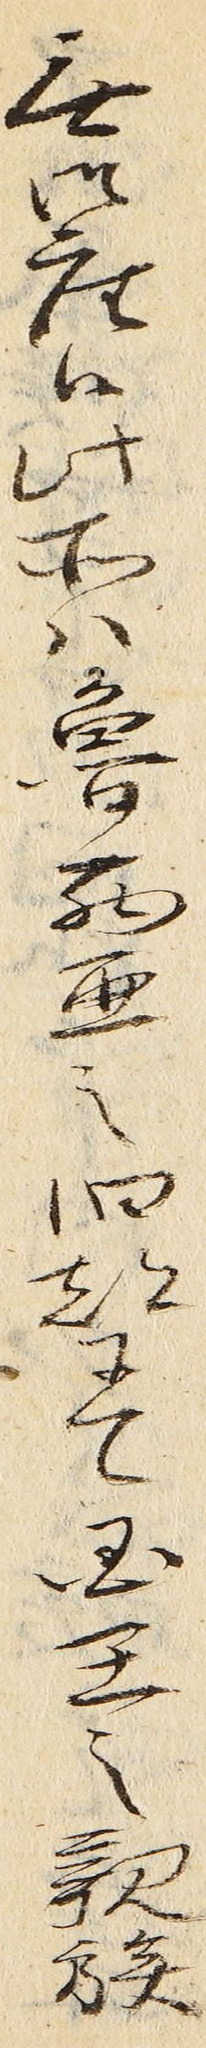無御座候此所は魯西亜之旧都にて国王之親族
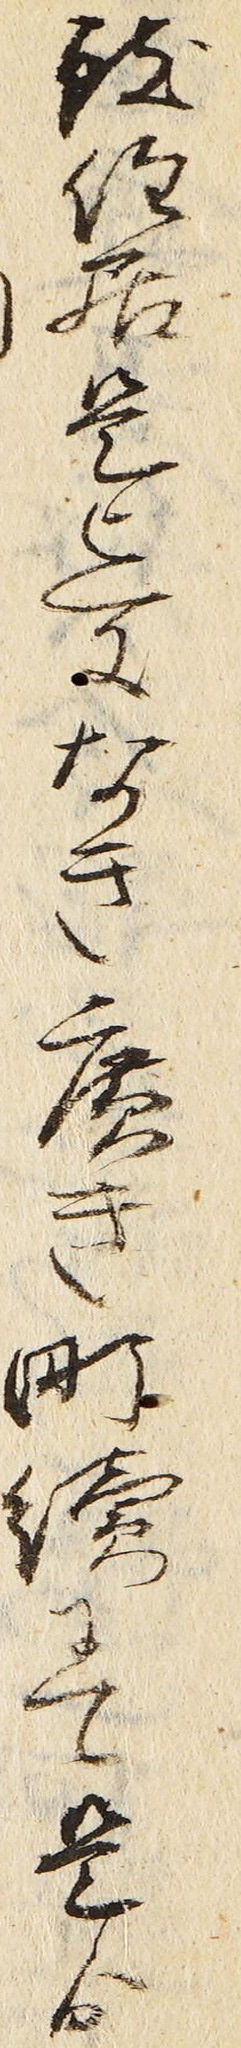致住居是迄になき広き町続にて是ゟ
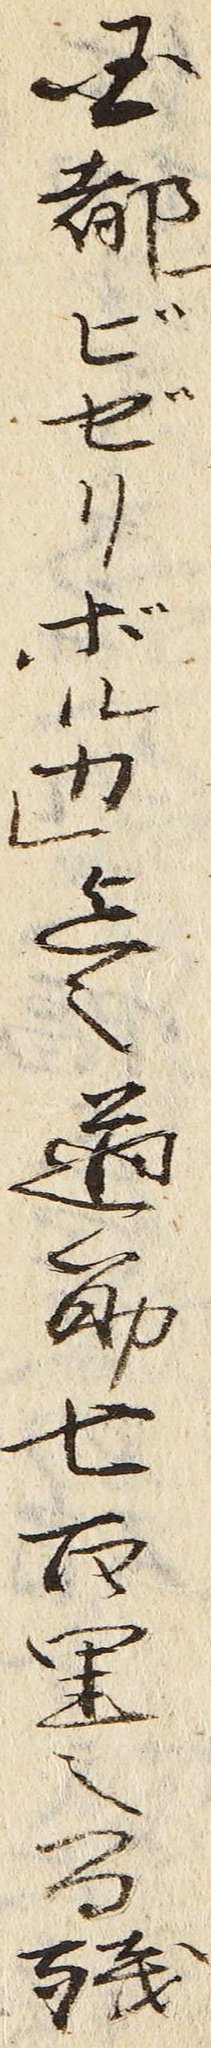国都「ビゼリボルカ」迄之道筋七百里之間残
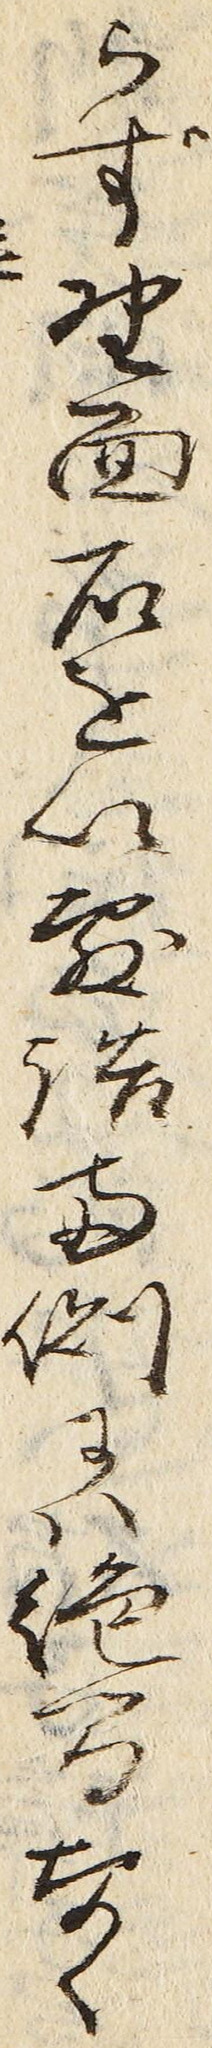らず野面石を以敷詰両側には絶間なく
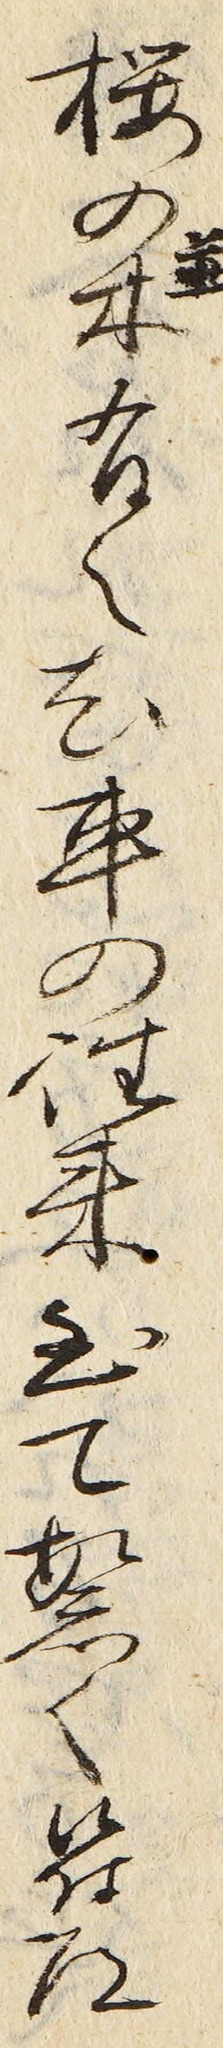桜の並木有之尤車の往来至て繁く候付道
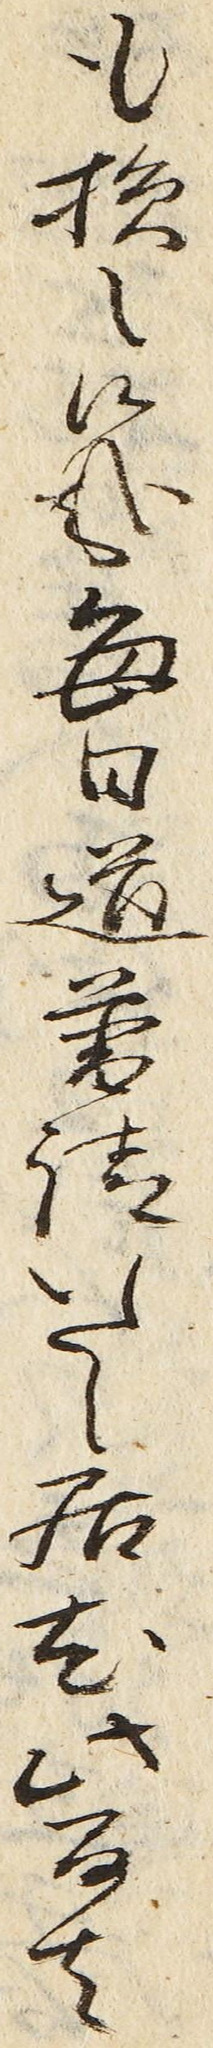も損し候哉毎日道普請いたし居尤此間は
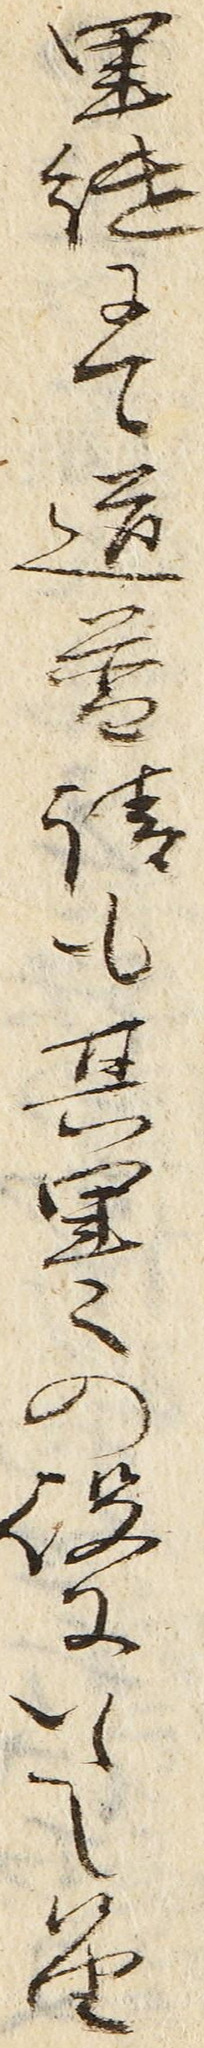里継にて道普請も其里々の役にいたし候由
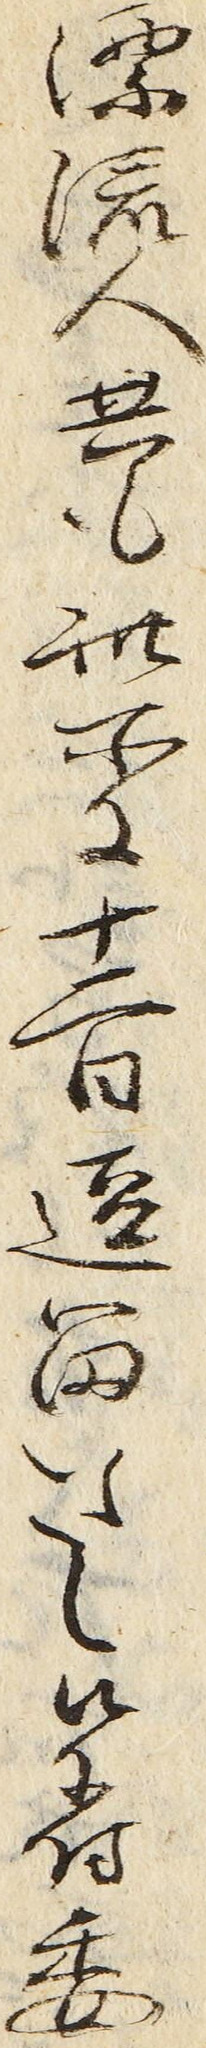漂流人共も此所に十二日逗留いたし候に付委
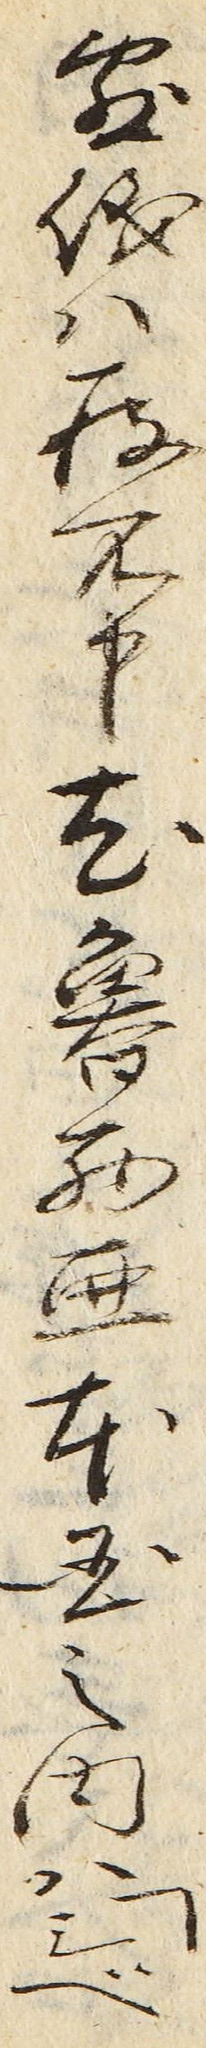敷儀は存不申尤魯西亜本国之内は「シベ
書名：漂民後記
